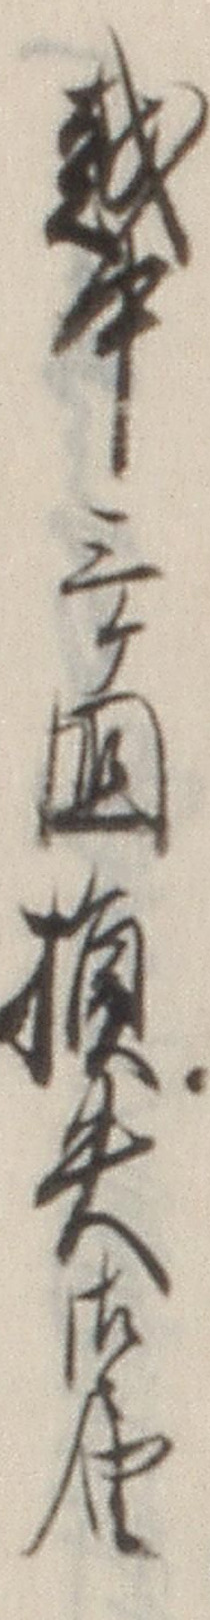越中三ケ国損失御届
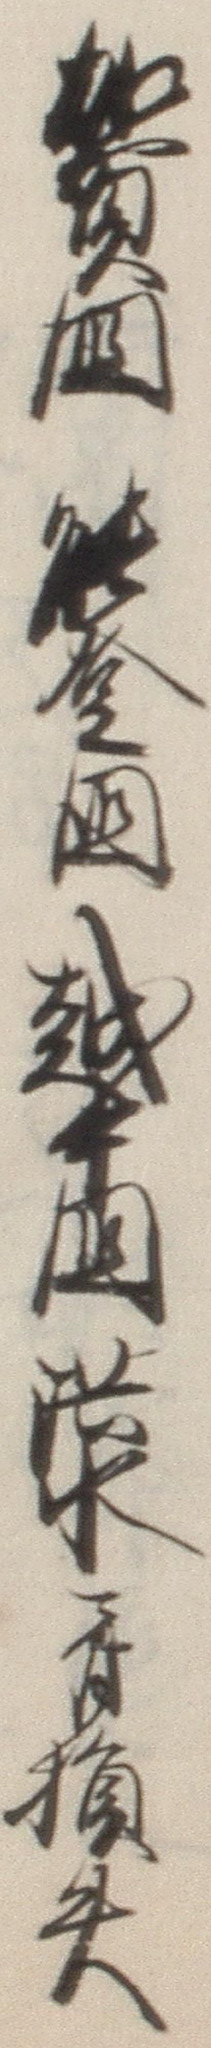加賀国能登国越中国洪水ニ付損失
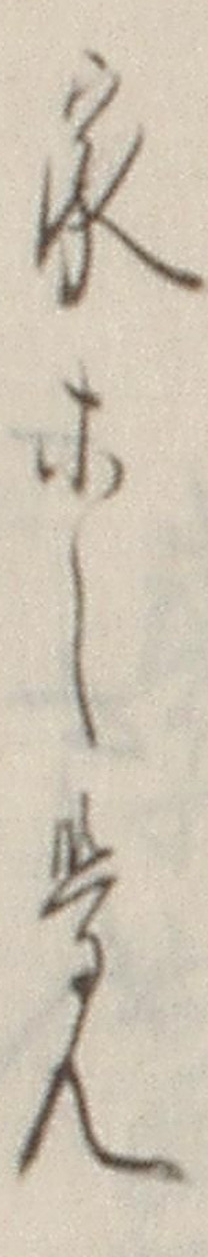家等之覚
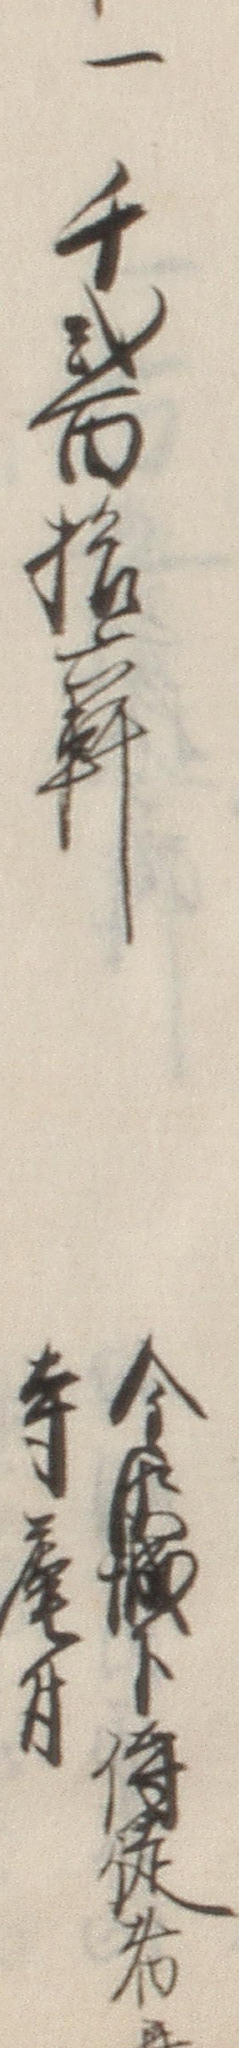一千弐百拾六軒金沢城下侍従者并
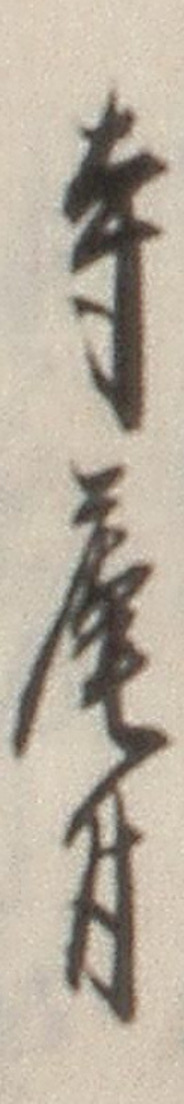寺庭付
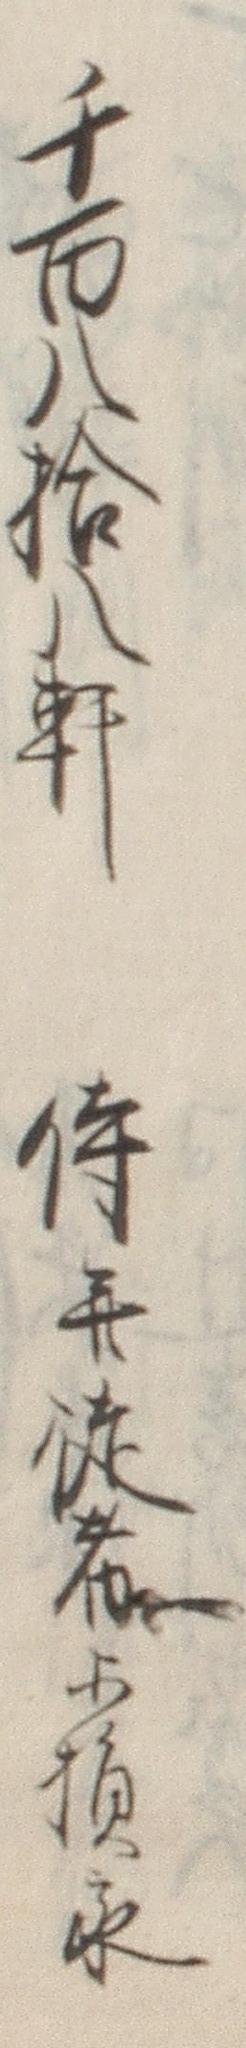千百八拾八軒侍并従者等損家
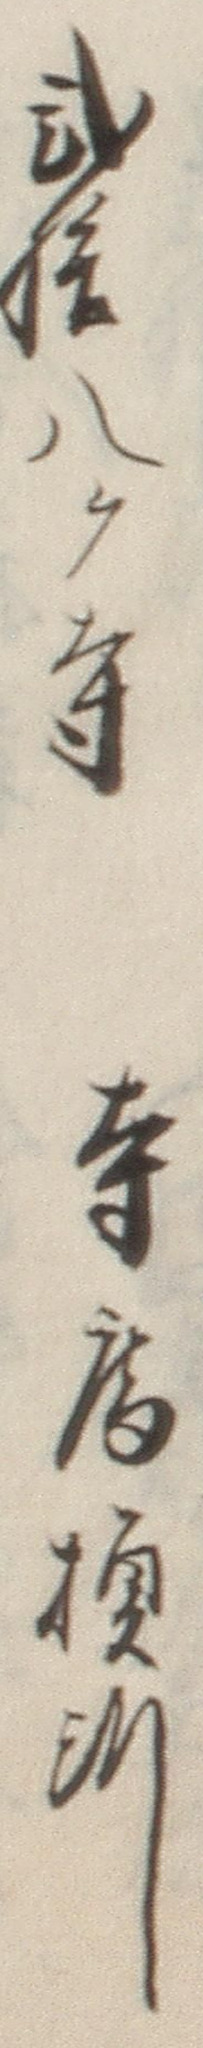弐拾八ケ寺寺庭損所
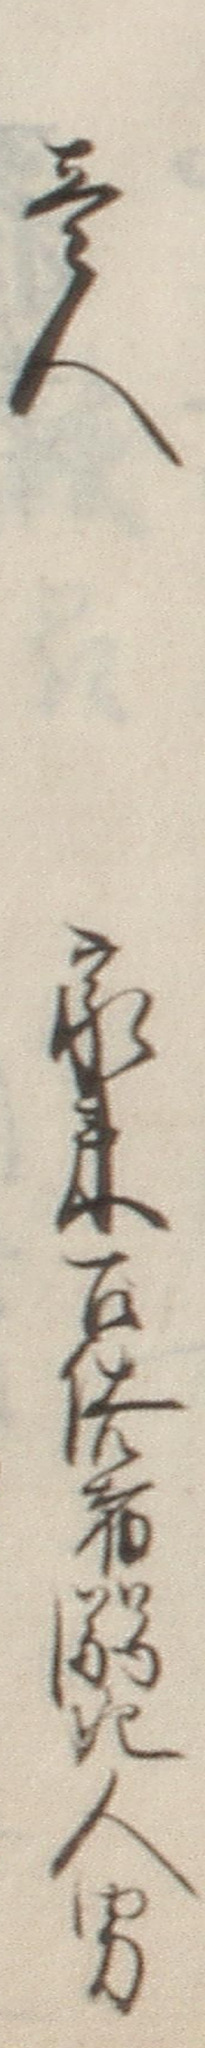一壱人家来召仕候者溺死人男

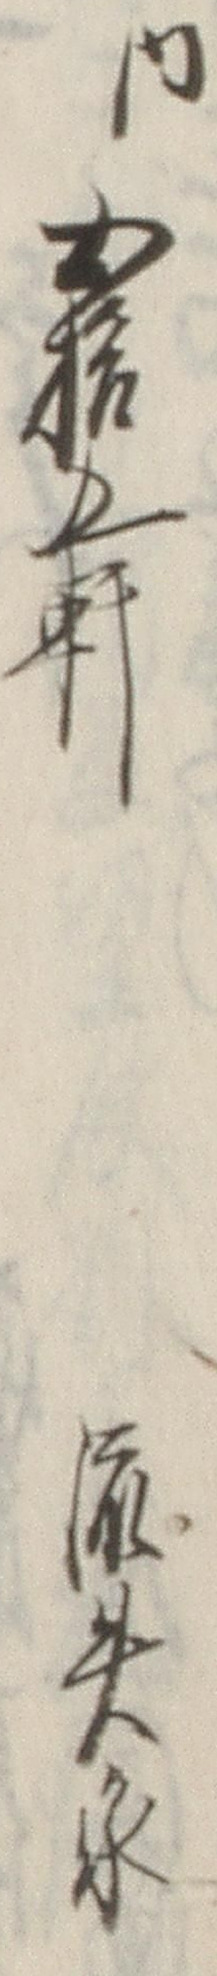内五拾五軒流失家
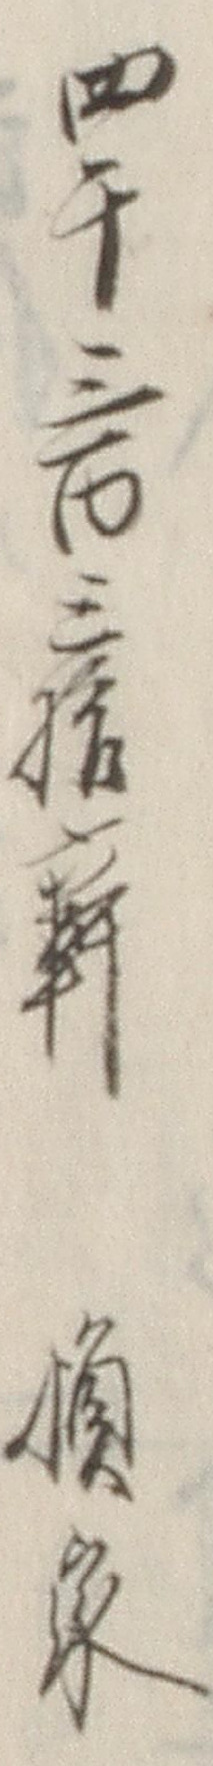四千三百三拾六軒損家
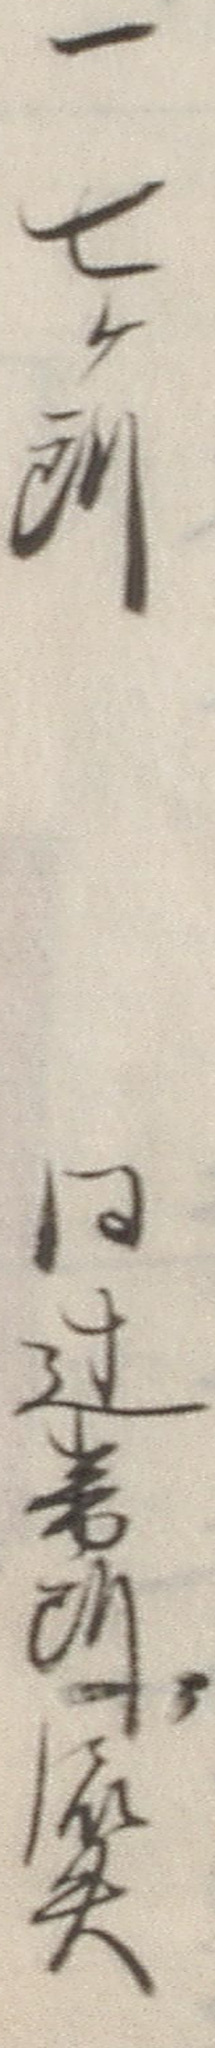一七ケ所同辻番所流失
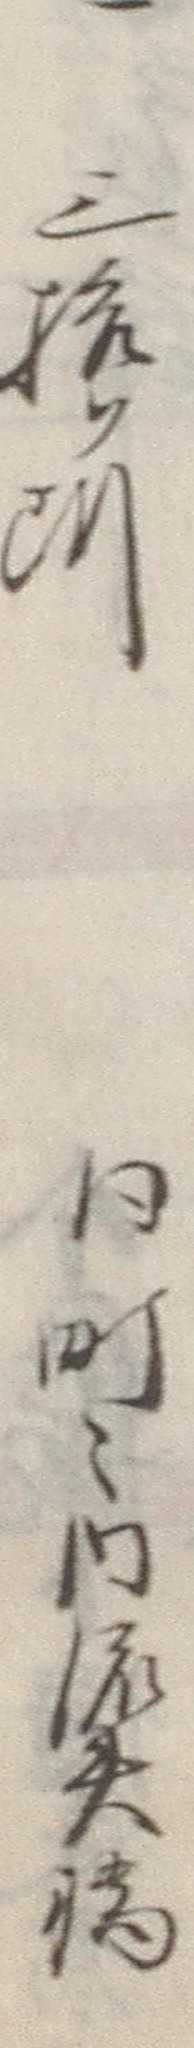一三拾ケ所同町之内流失橋
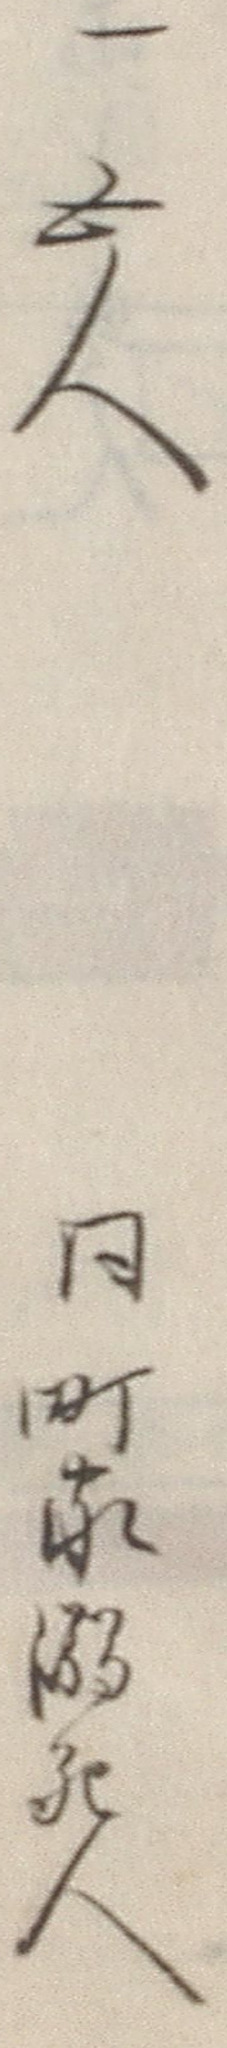一五人同町家溺死人
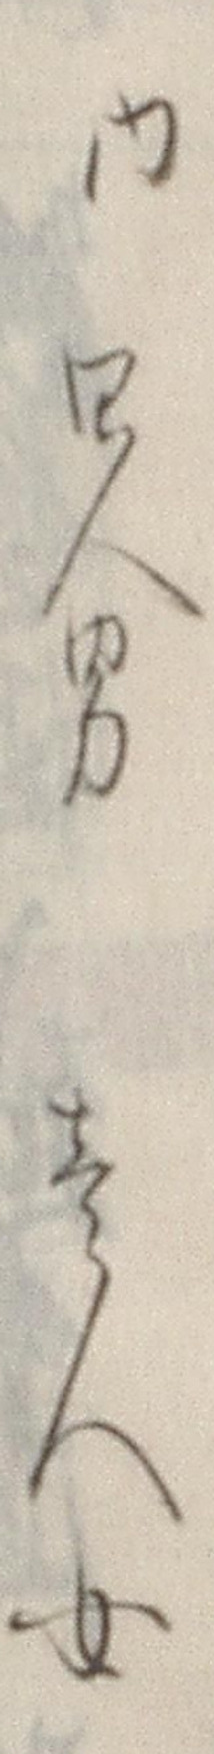内四人男壱人女
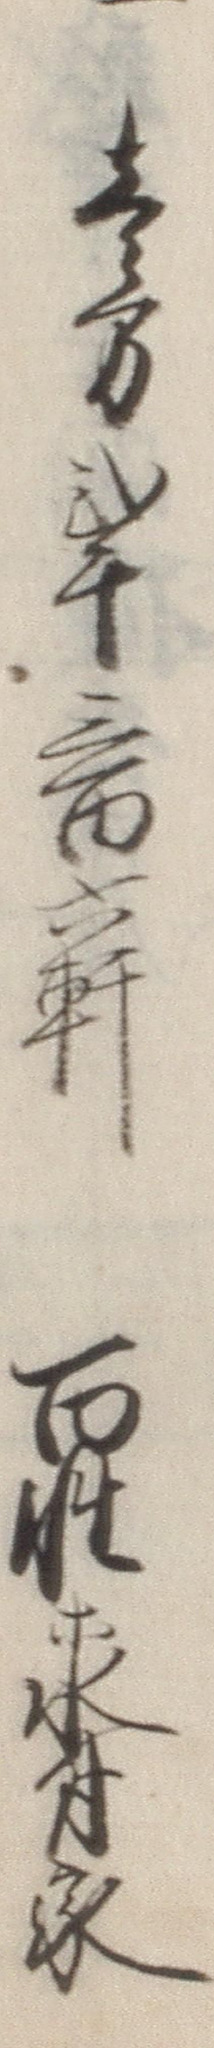壱万弐千三百六軒百姓等水付家
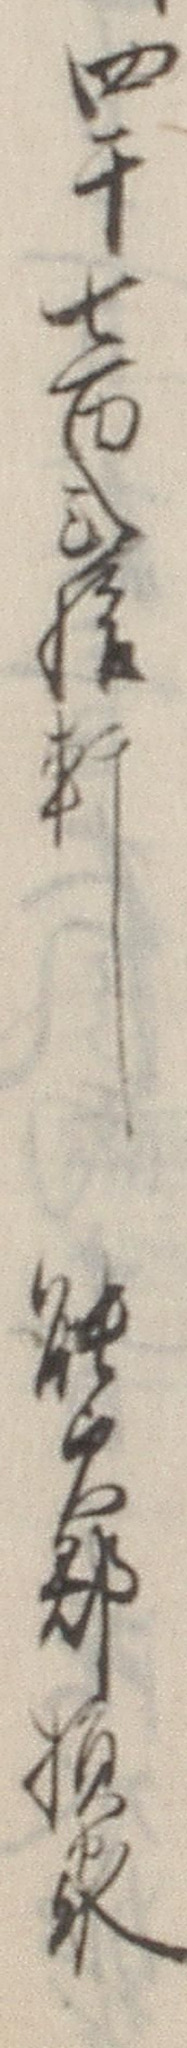四千七百弐拾軒能登郡損家
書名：[諸国災害記録]
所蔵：東京大学地震研究所図書室 Earthquake Research Institute Library, The University of Tokyo, JAPAN
